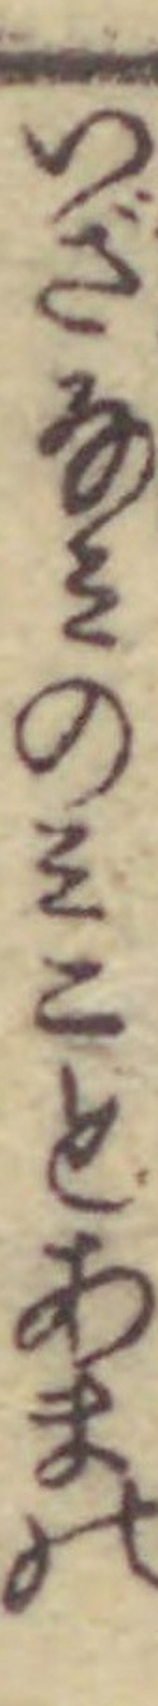いざなみのみことあまの
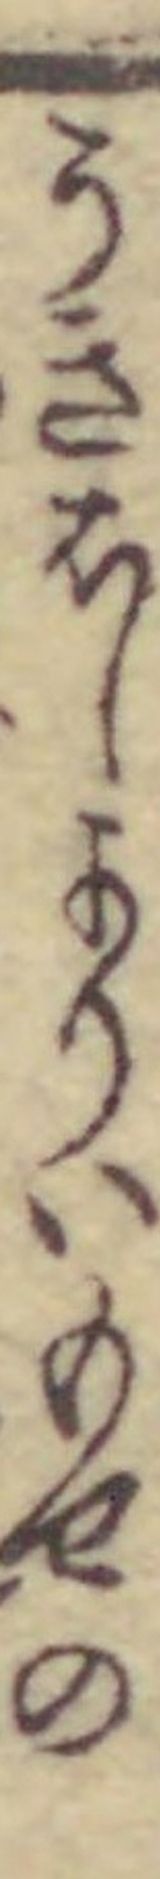うきはしよりいもせの
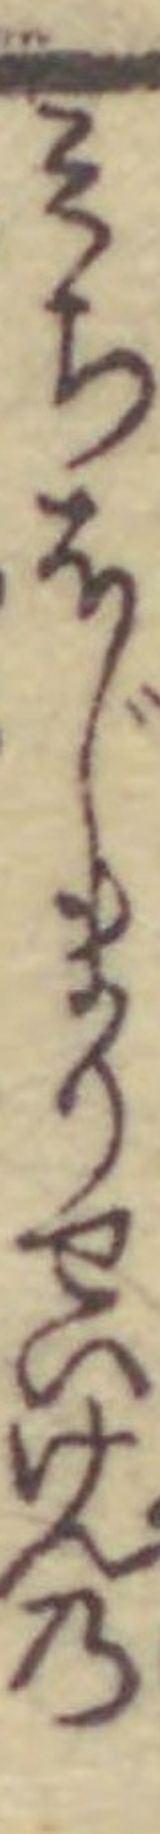みちはじまりせいけんの
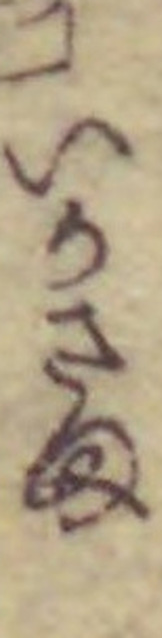いかさま
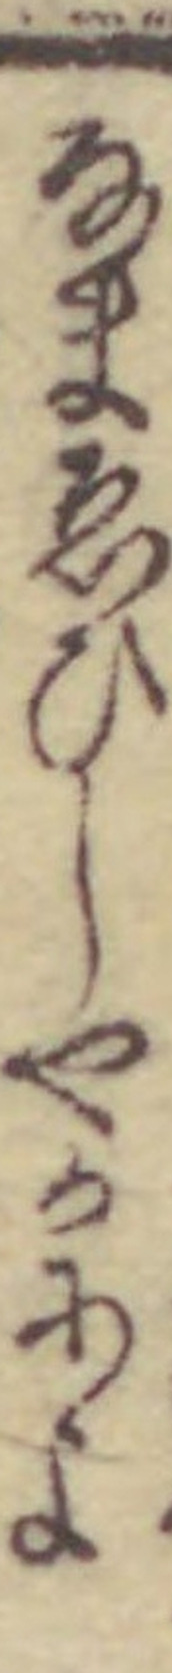なまゑひしやかによ
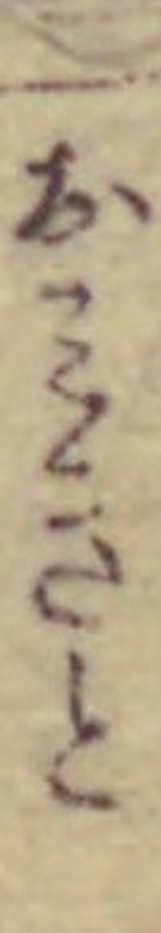おみきと
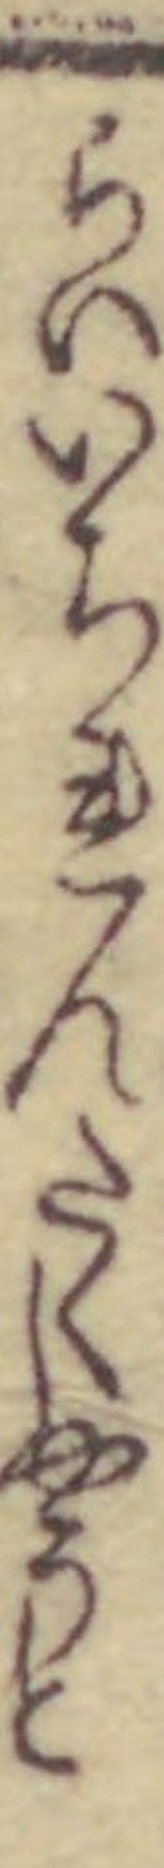らいいちれんたくしやうと
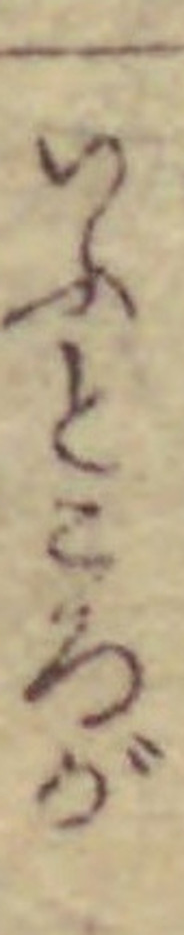いふところが
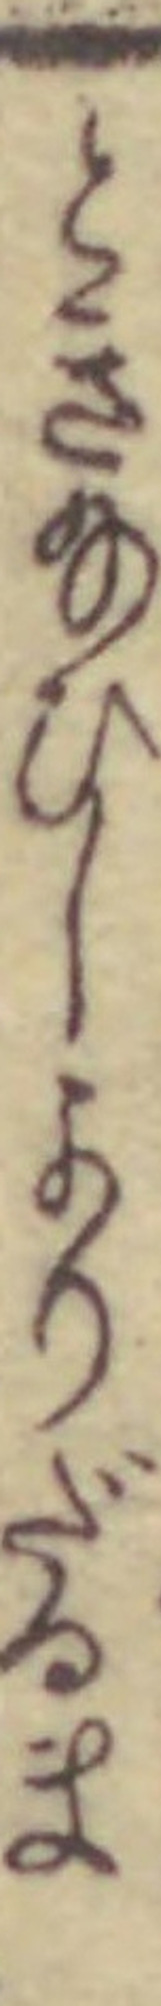とき給ひしよりだるま
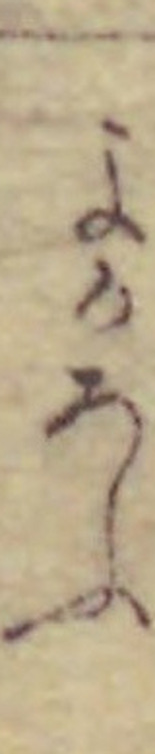よかろふ
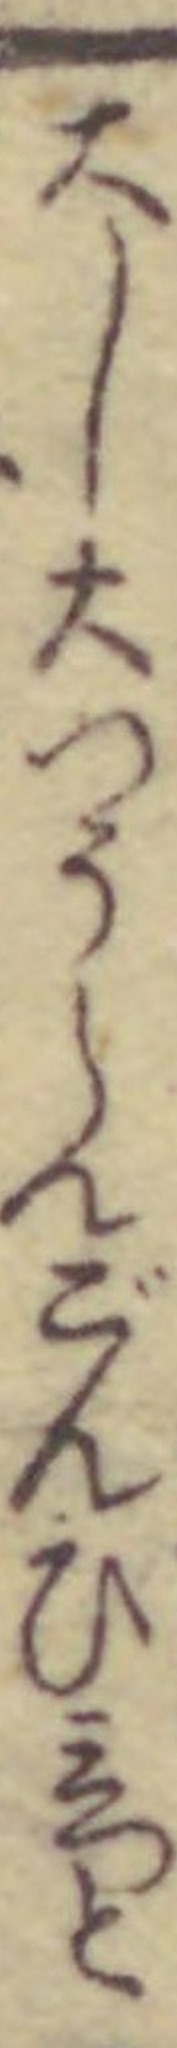大し大つうしんごんひみつと
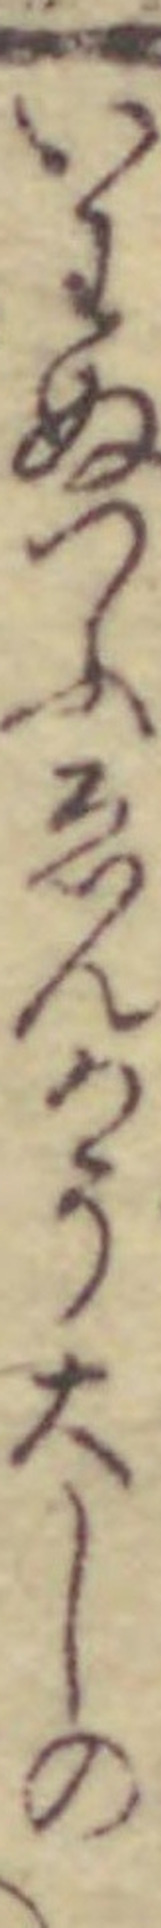いわぬつふゑんかう大しの
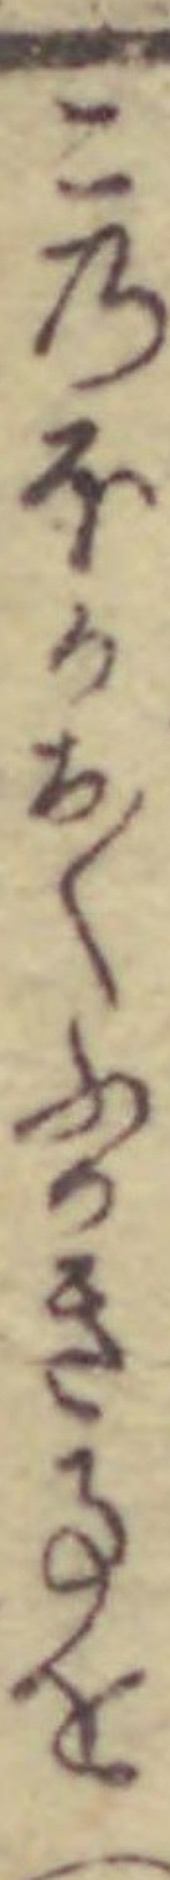このほかおくふかき事を
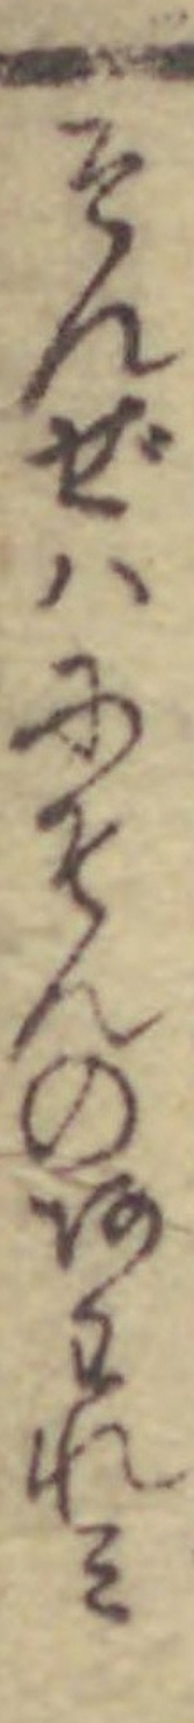そんぜはにそんのあわれみ
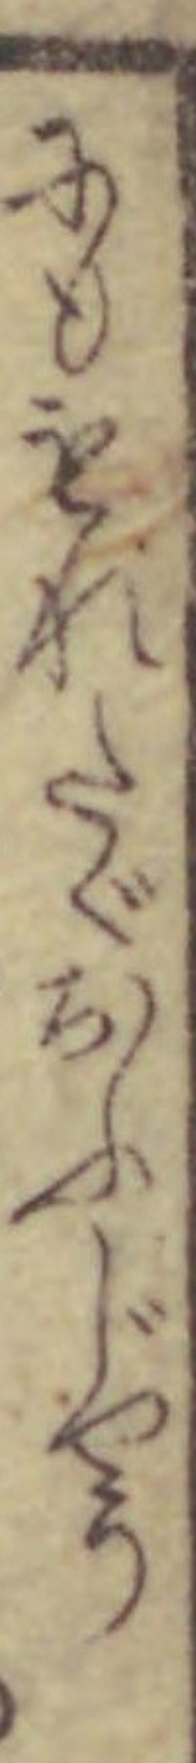にももれたゞおふじやう
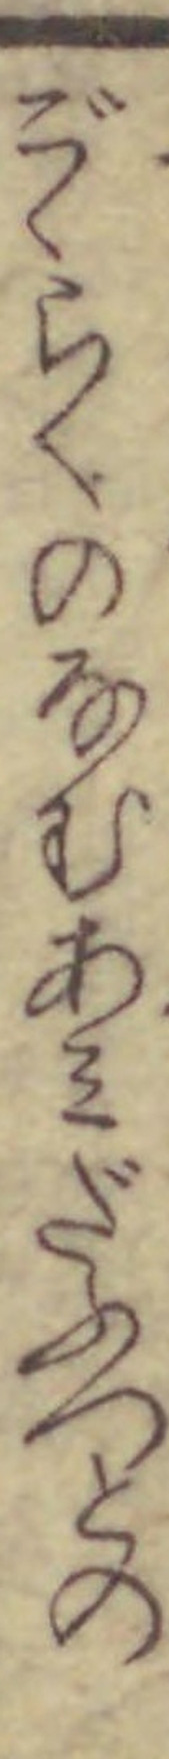ごくらくのなむあみだふつとの
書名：大通人穴[サガシ] 3巻
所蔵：国立国会図書館 National Diet Library, JAPAN
